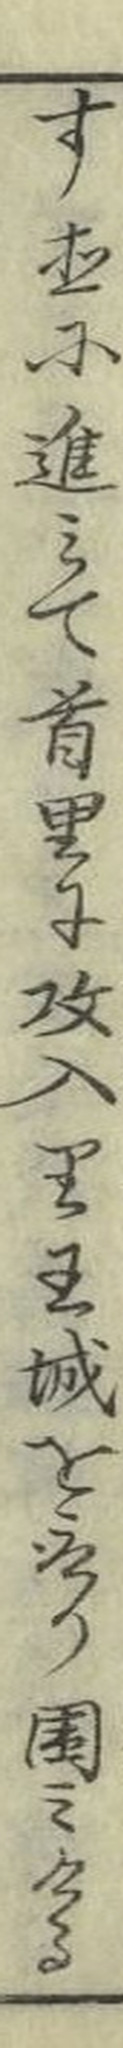ず直に進みて、首里に攻入り、王城を取り囲みける
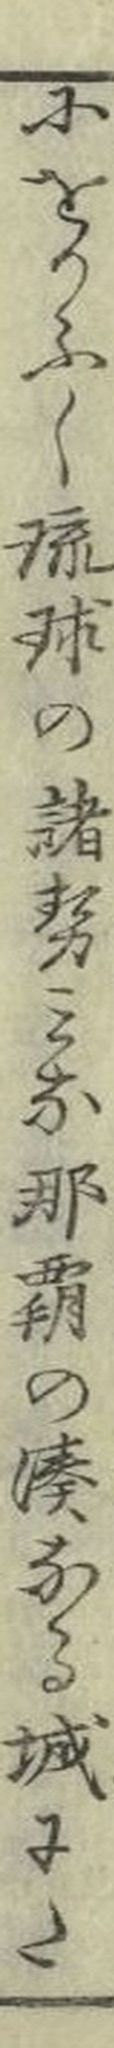に、をりふく琉球の諸勢、みな那覇の湊なる城にた
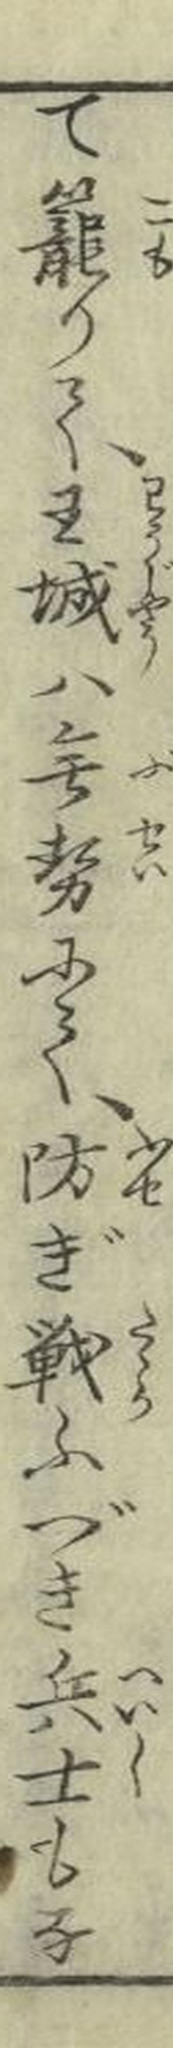て籠りて、王城は無勢にて、防ぎ戦ふべき兵士もな
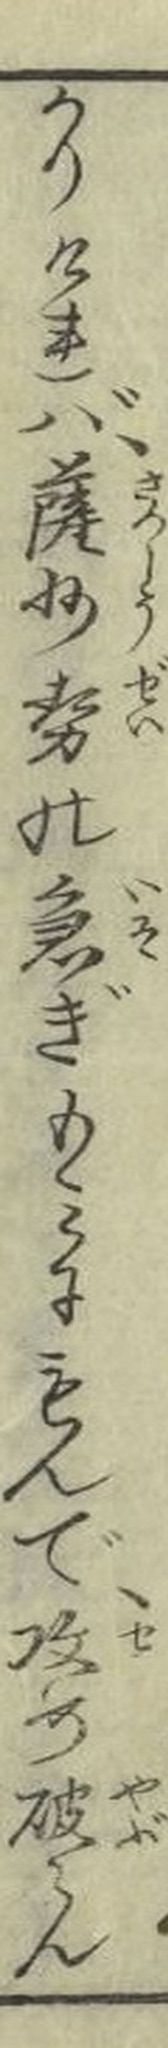かりければ、薩州勢の急ぎもみにもんで、攻め破らん
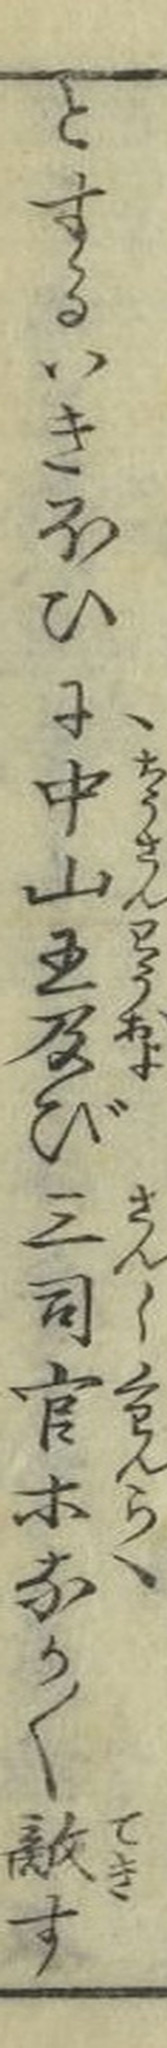とするいきほひに、中山王及び三司官等、なか〳〵敵す

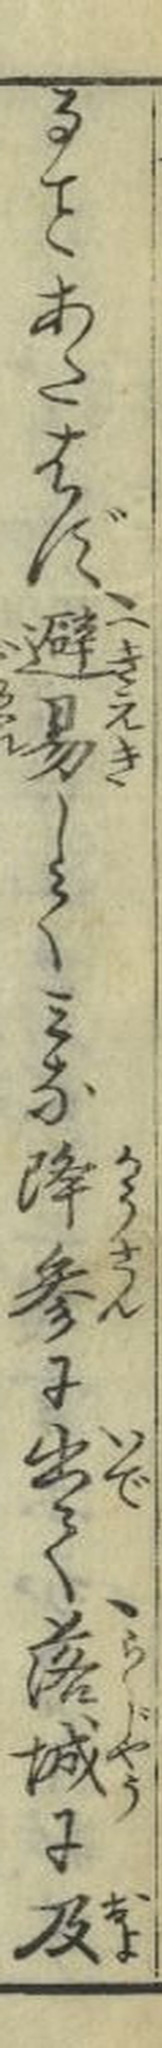ることあたはず、避易してみな降参に出て、落城に及
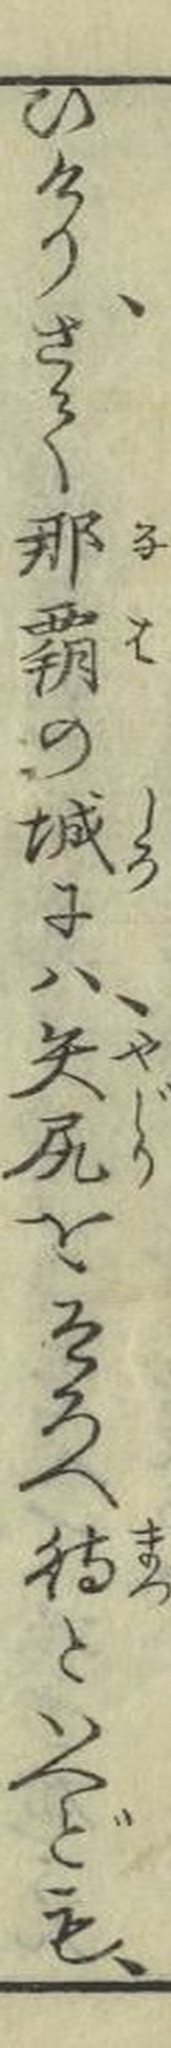ひけり、さて那覇の城には矢尻をそろへ待といへども、
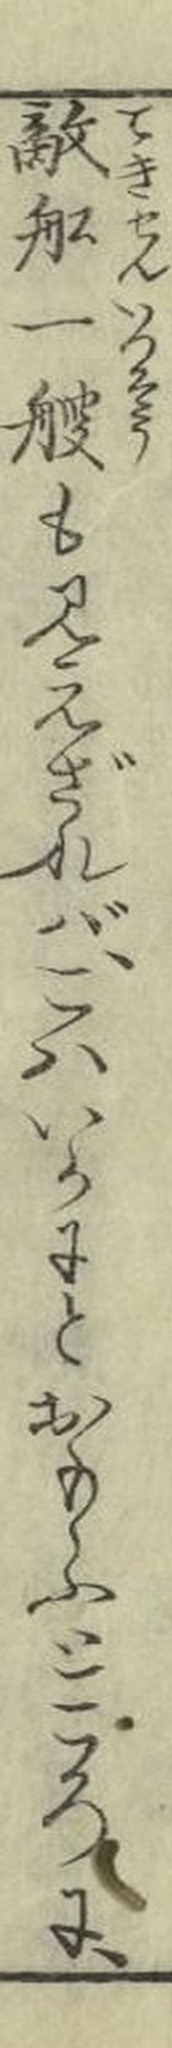敵船一艘も見えざれば、こはいかにとおもふところに、
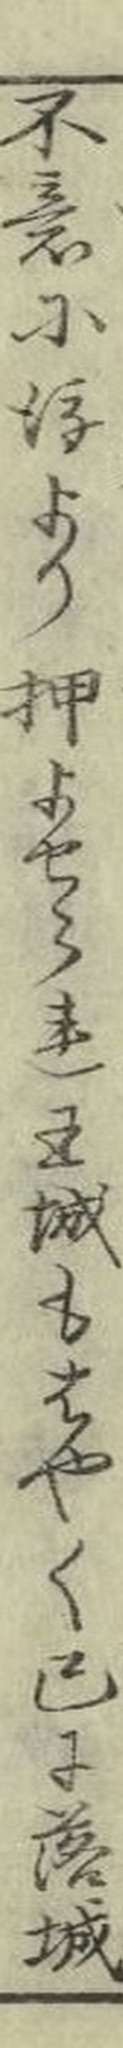不意に後より押よせられ、王城もはやく已に落城
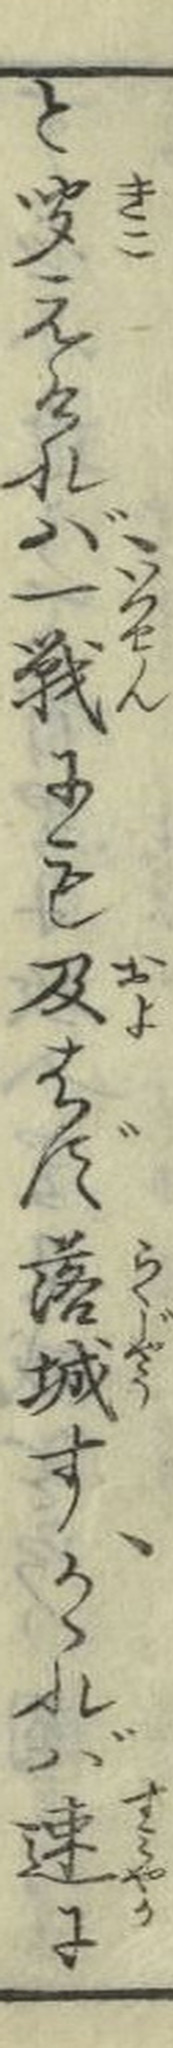と聞えければ、一戦にも及はず落城す、かゝれば速に
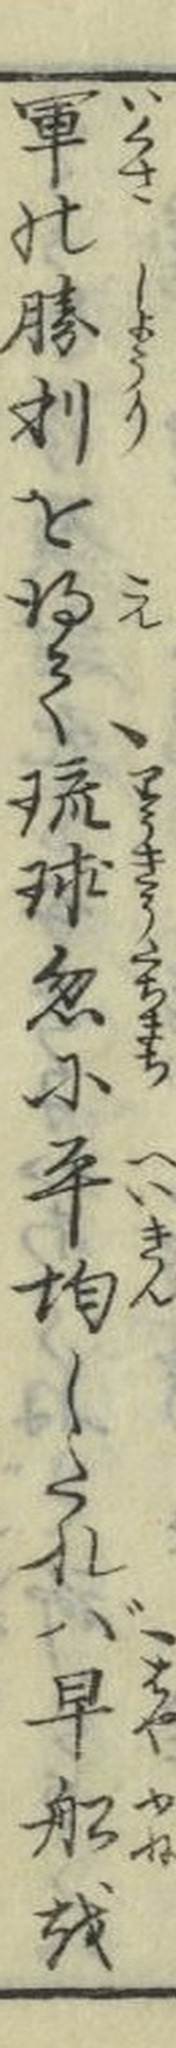軍の勝利を得て、琉球忽に平均したれば、早船を
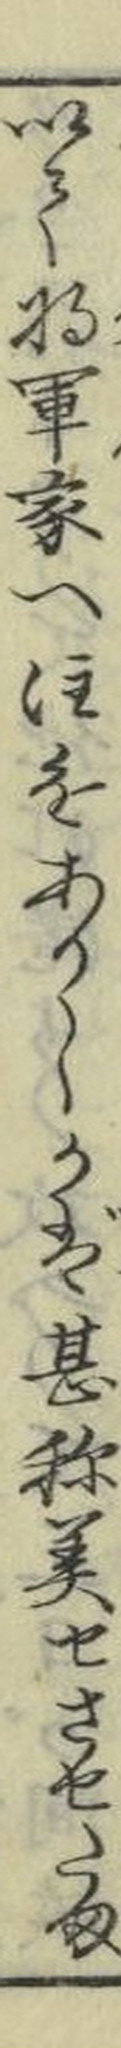以て将軍家へ注進ありしかば、甚称美せさせたま
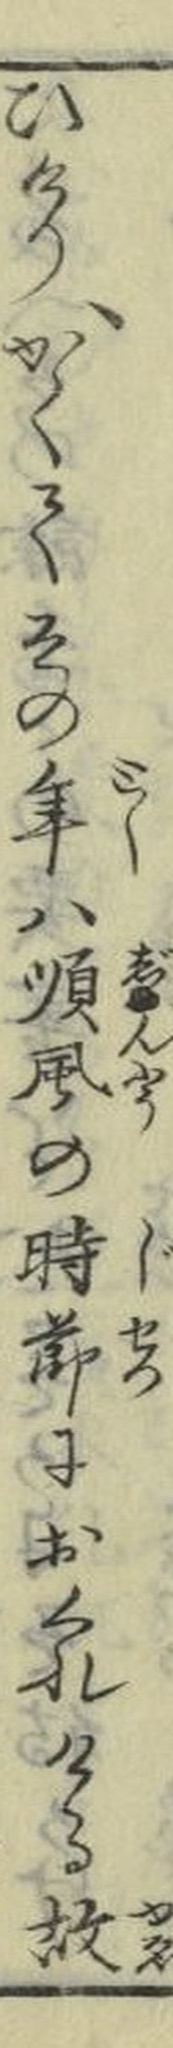ひけり、かくてその年は順風の時節におくれける故
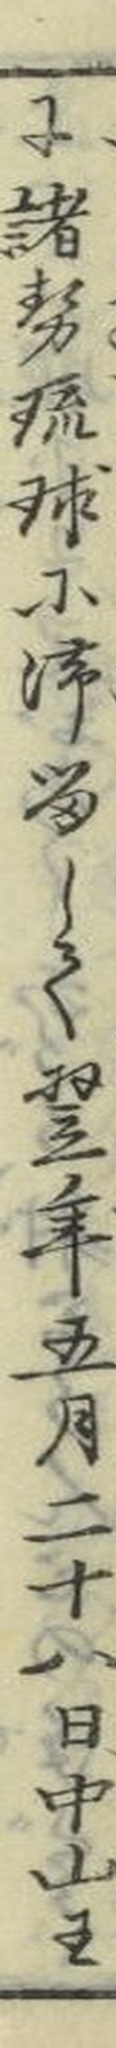に、諸勢琉球に滞留して、翌年五月二十八日、中山王
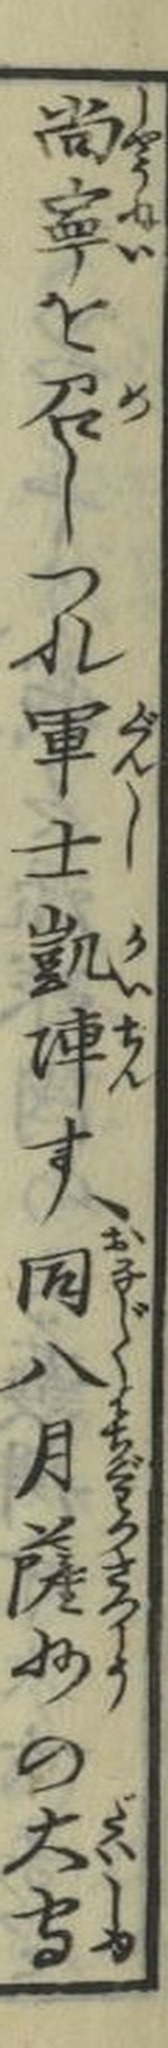尚寧を召しつれ軍士凱陣す、同八月薩州の大守
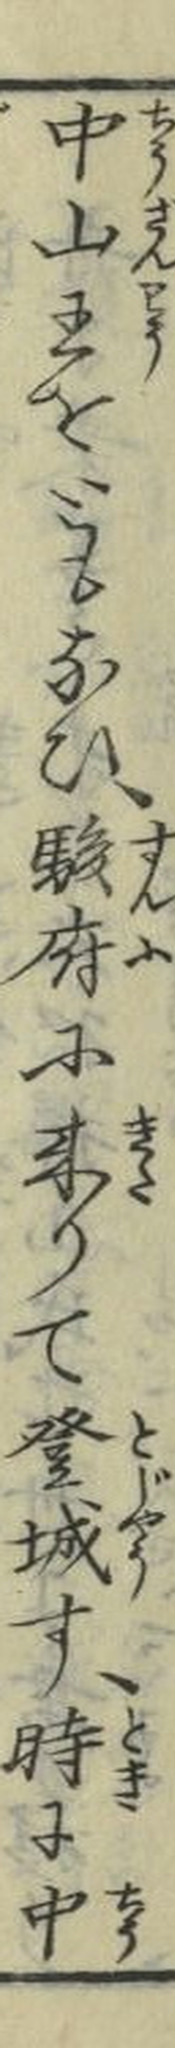中山王をともなひ、駿府に来りて登城す、時に中
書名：琉球入貢紀略
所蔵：University of the Ryukyus Library
